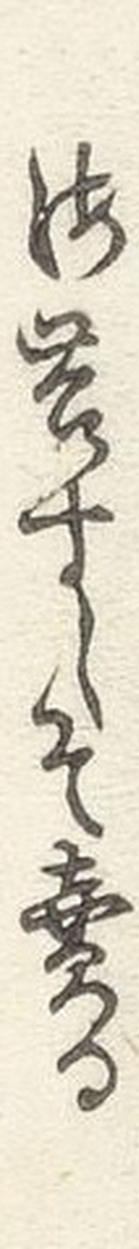海苔すしそ売る
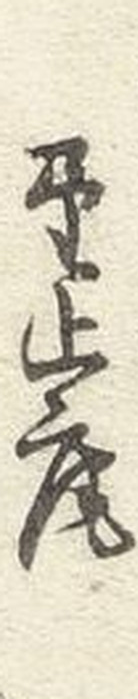望止庵
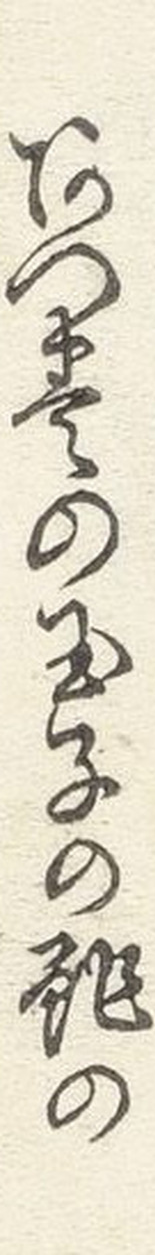あつ巻の玉子の鮨の
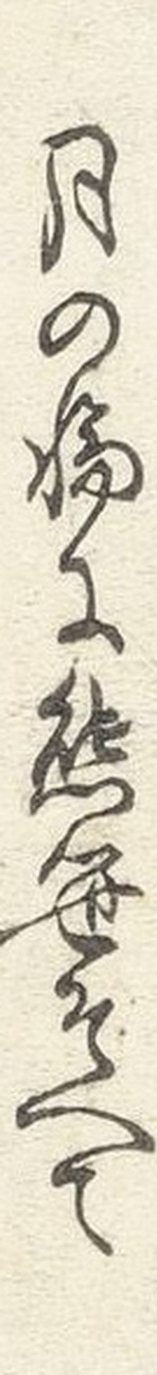月の輪に熊笹そへて
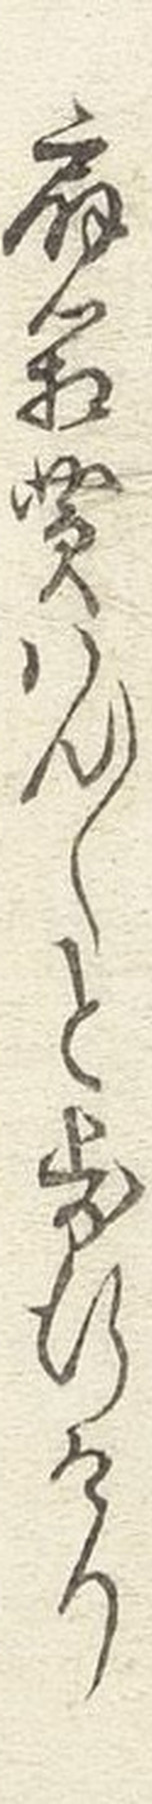扇箱買はん〳〵と歩行けり
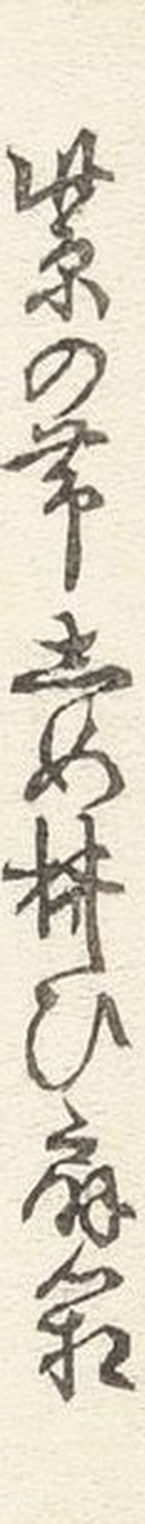紫の帯しめ払ひ扇箱
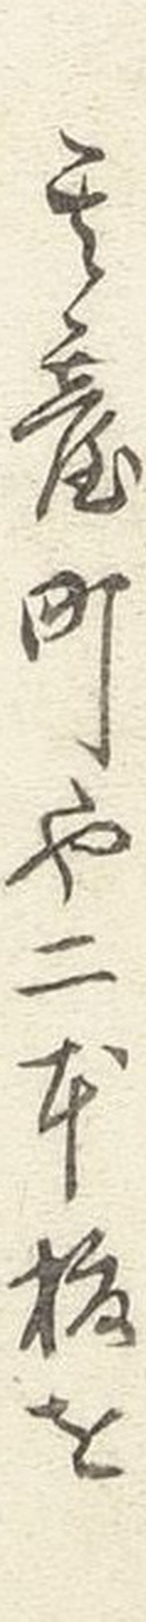其台町や二本抜を
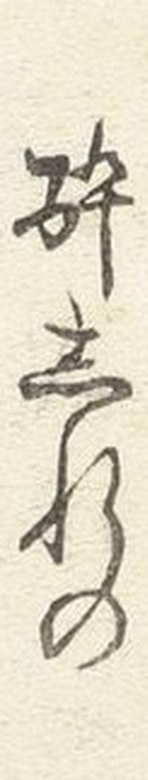酔しれの
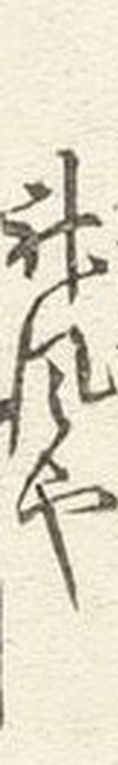神風や
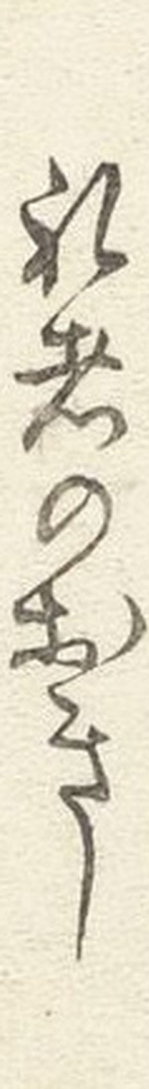礼者のおきし
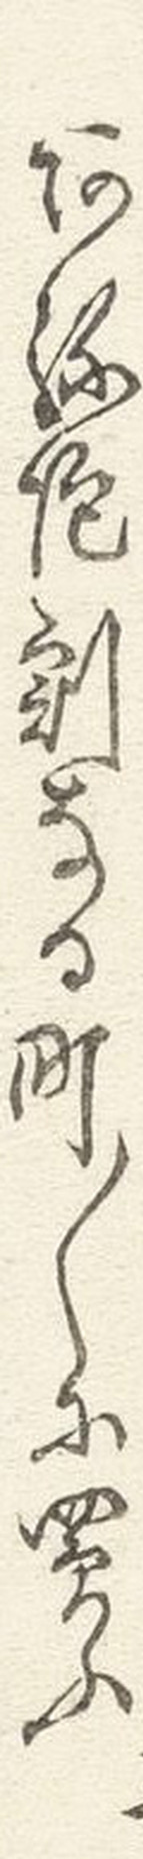阿弥陀割なる町〳〵に買ふ青則
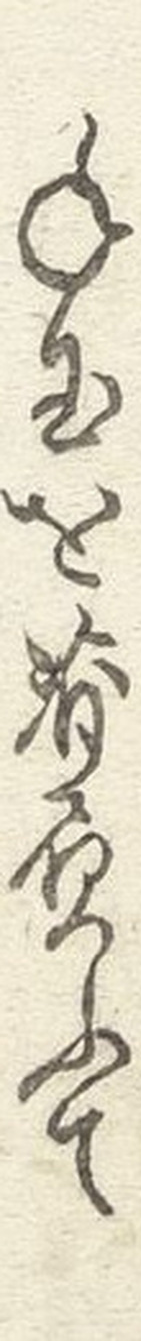年玉を背負ふて
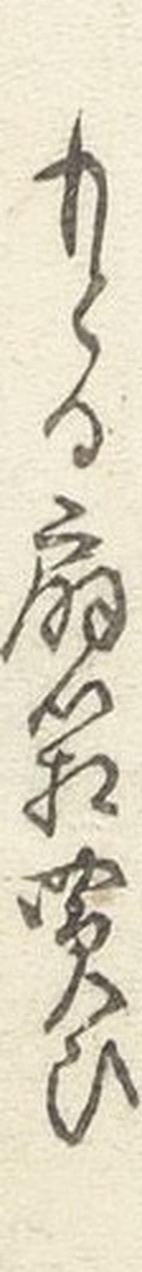もとる扇箱買ひ
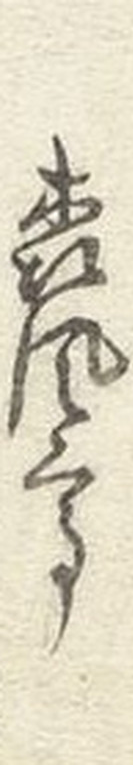森風亭
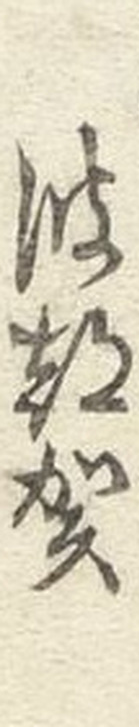波都賀
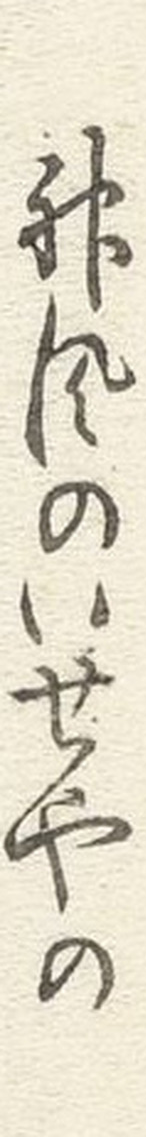神風のいせやの
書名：Picture Album of People with Kyōka (Light Verse) (Kyōka shiki jinbutsu 狂歌四季人物)
